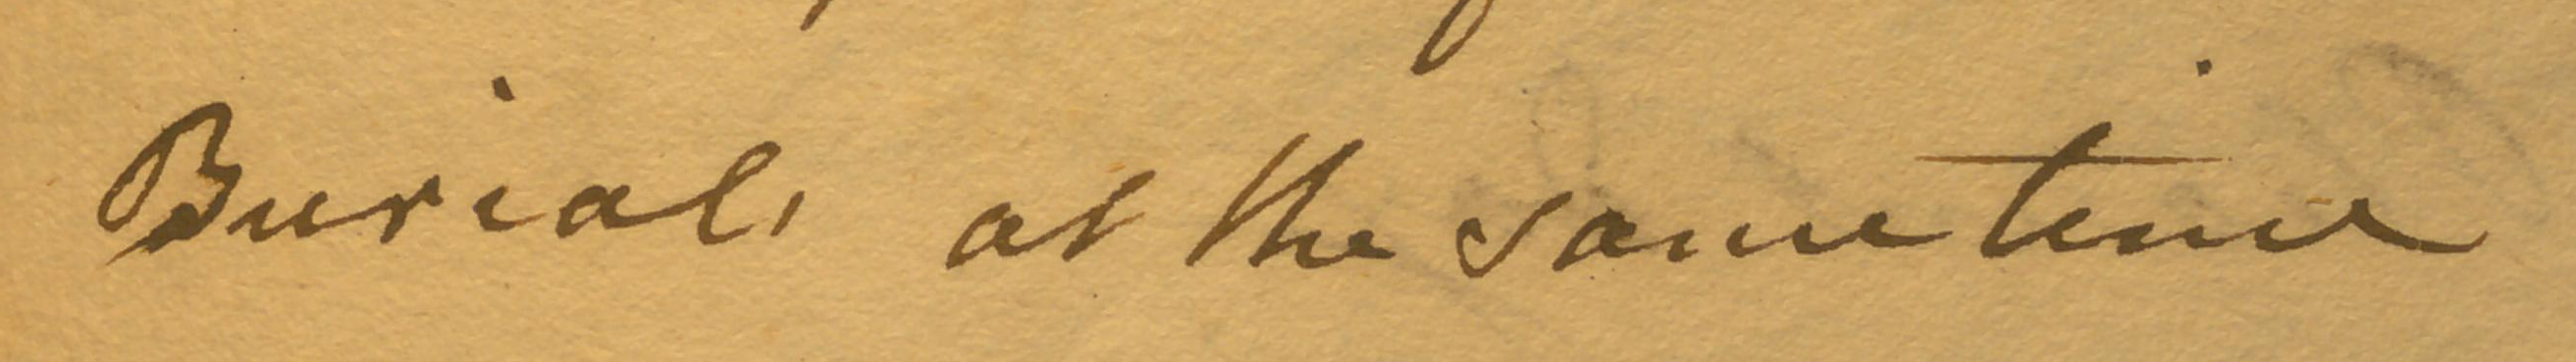Burials at the same time
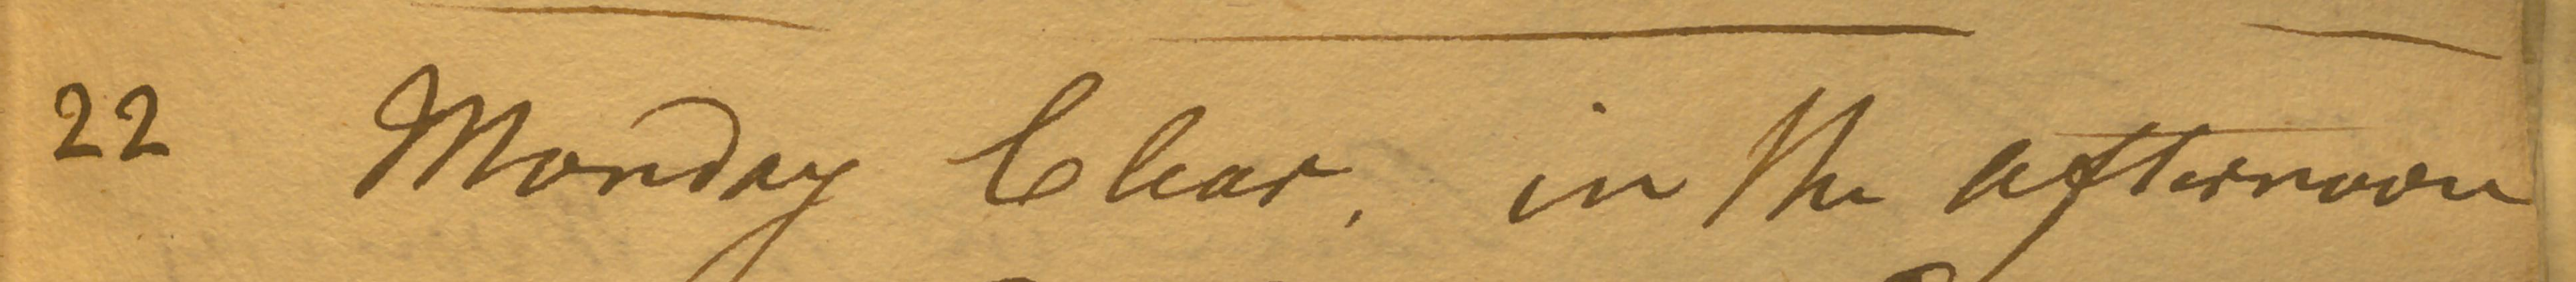22 Monday Clear, in the afternoon
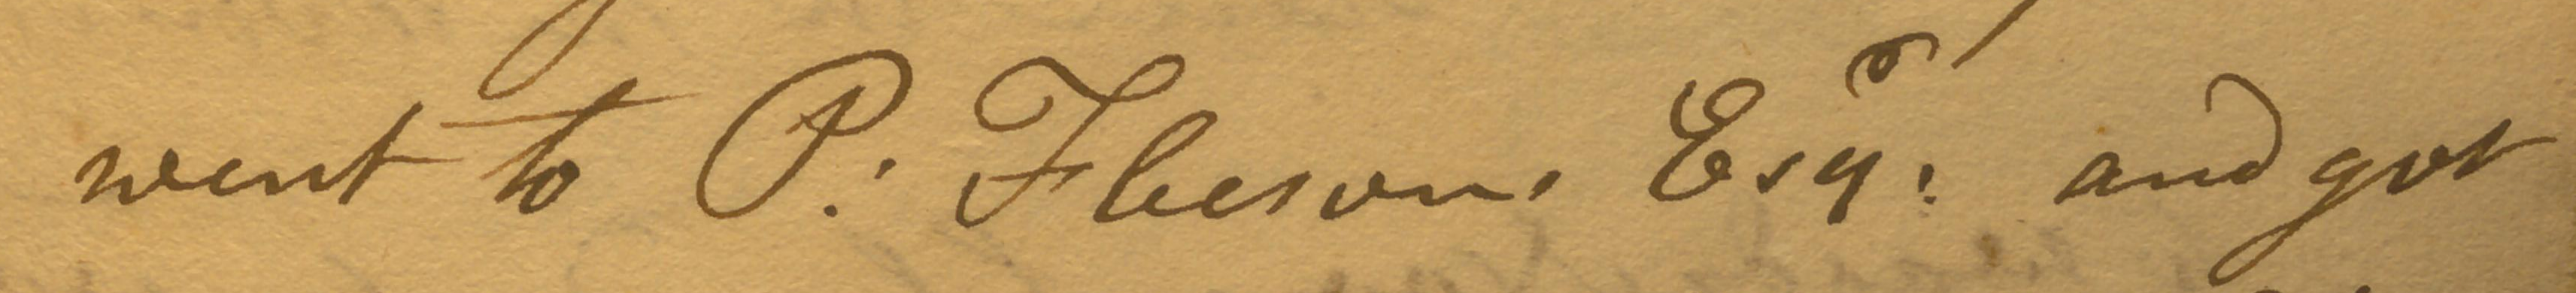went to P. Fleesons Esq^r. and got
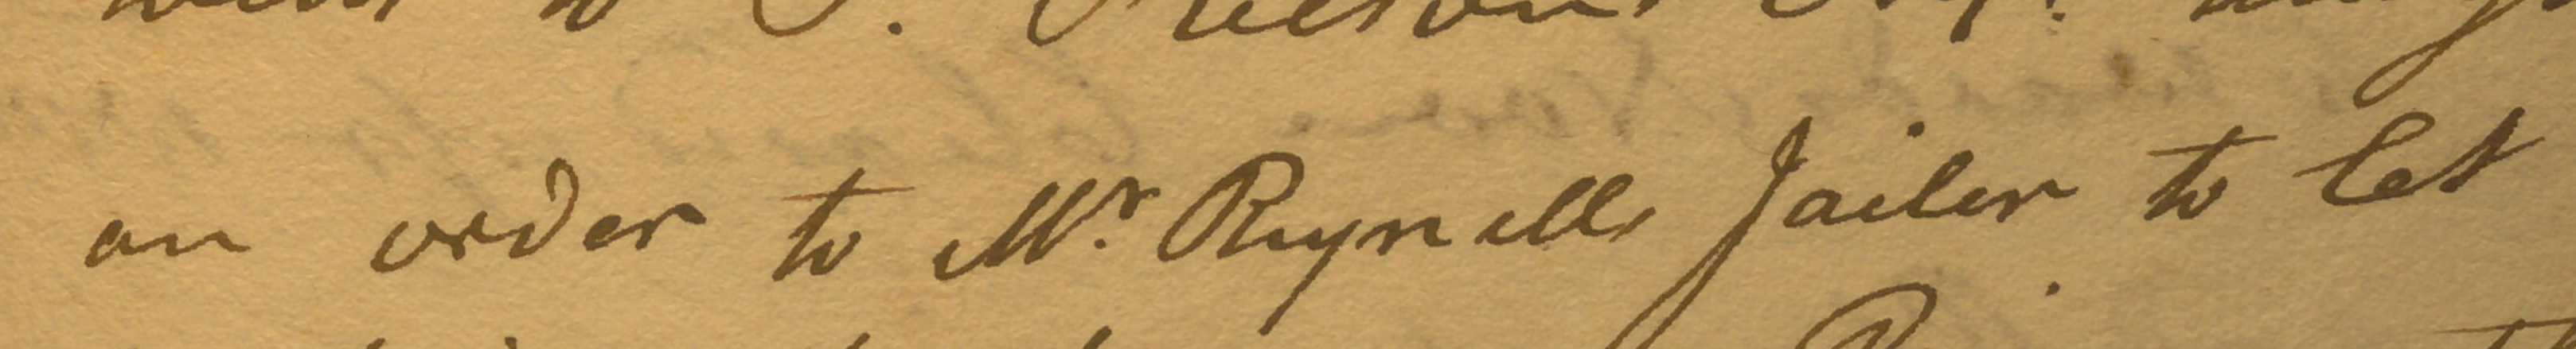an order to M^r. Reynells Jailer to let
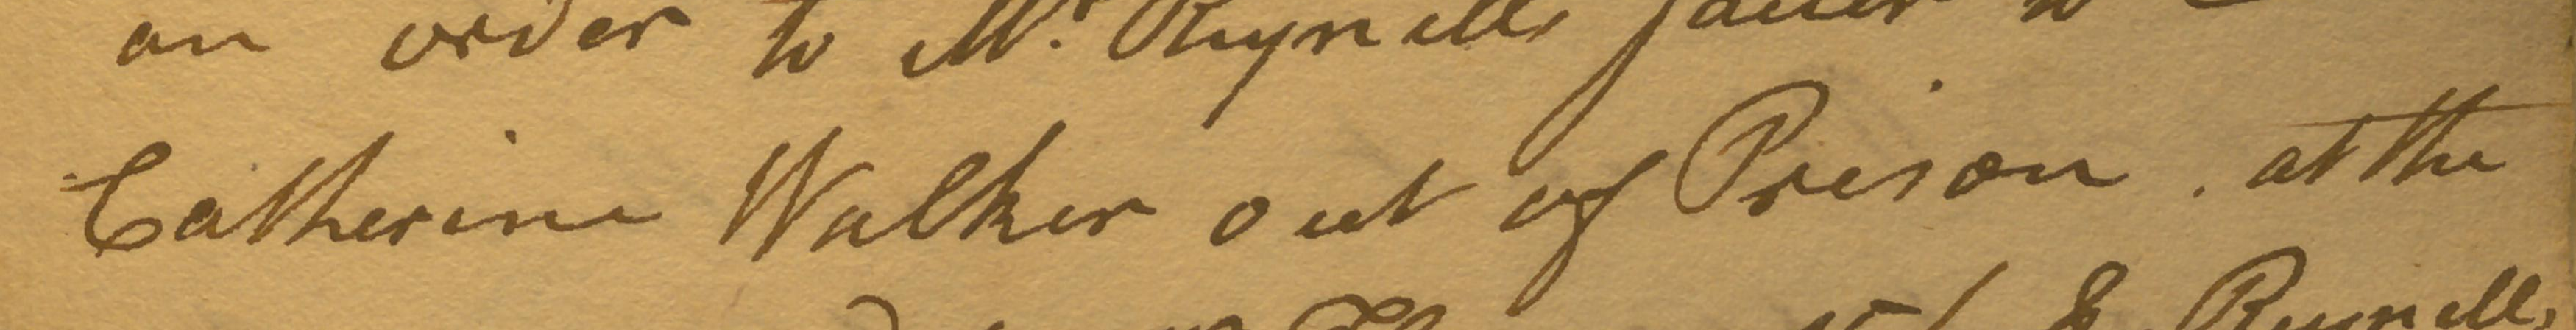Catherine Walker out of Prison, at the
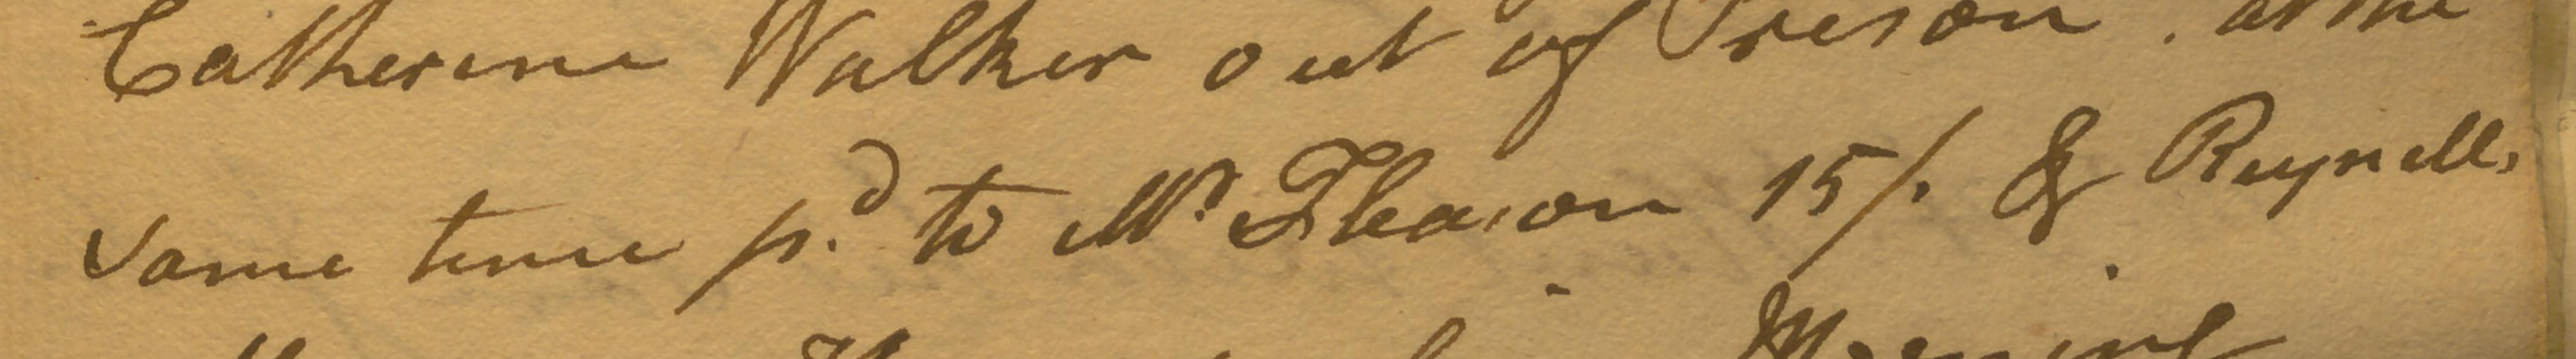same time p^d. to M^r. Fleason 15s. & Reynells
